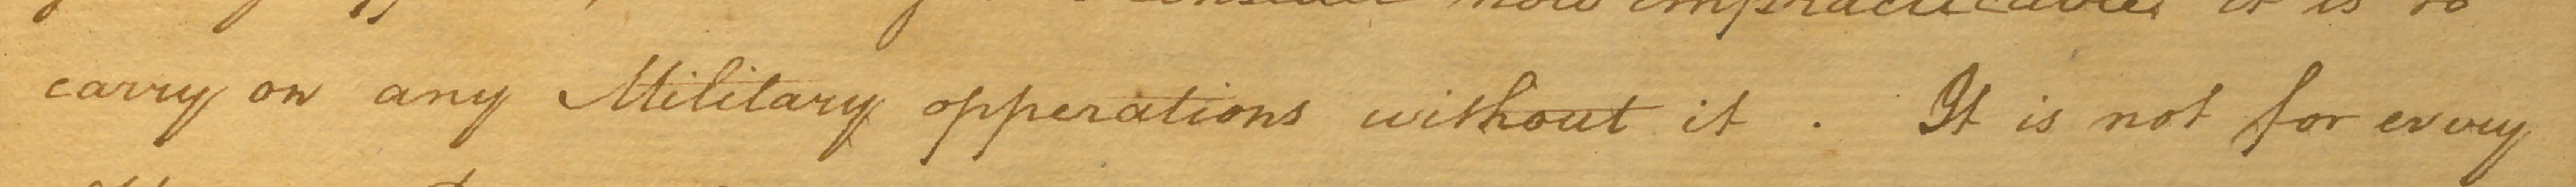carry on any Military opperations without it. It is not for every
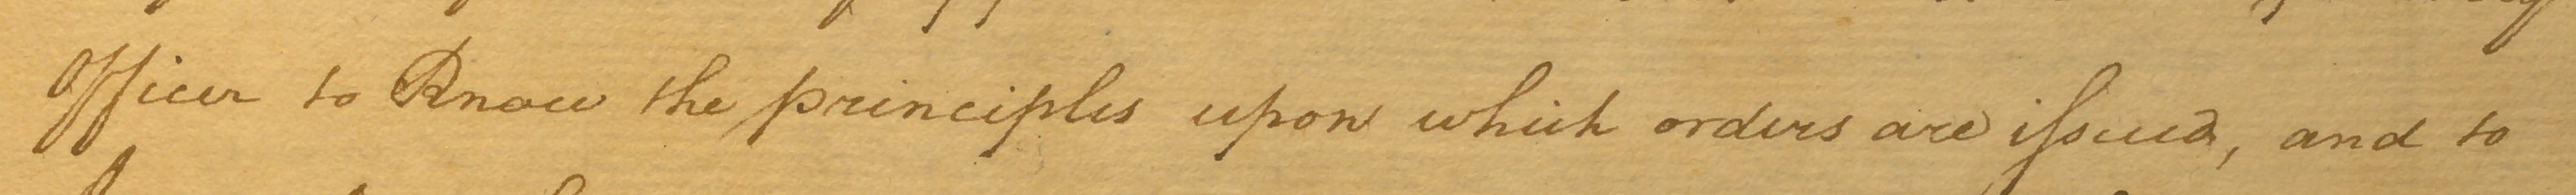Officer to know the principles upon which orders are issued, and to
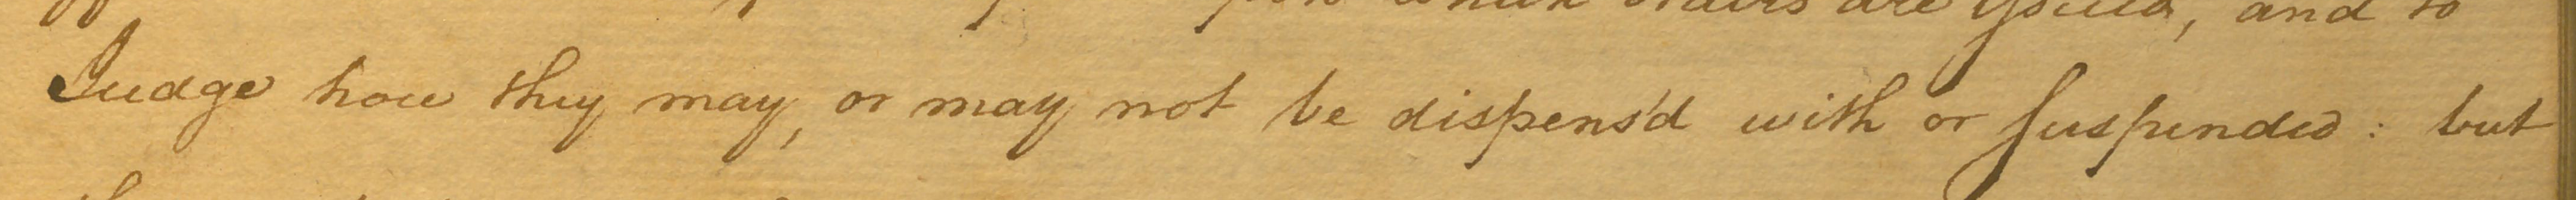Judge how they may or may not be dispens'd with or Suspended: but
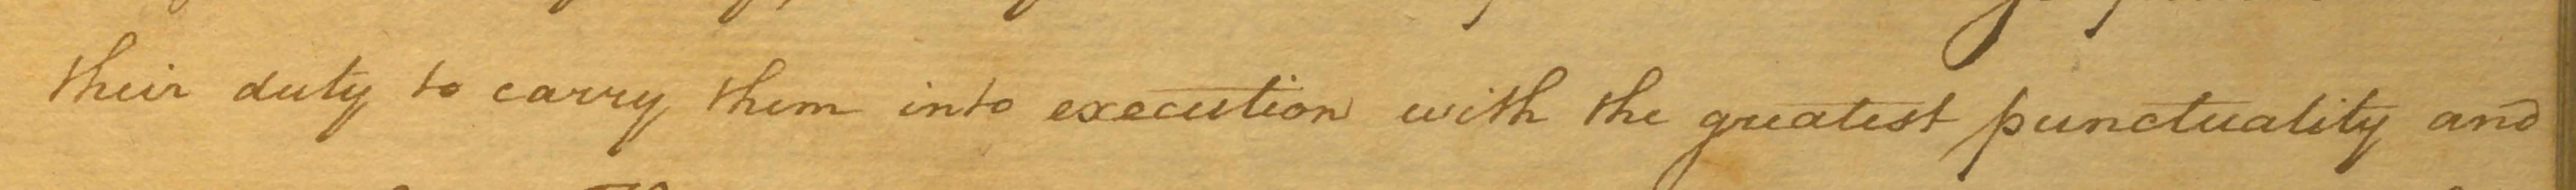their duty to carry them into execution with the greatest punctuality and
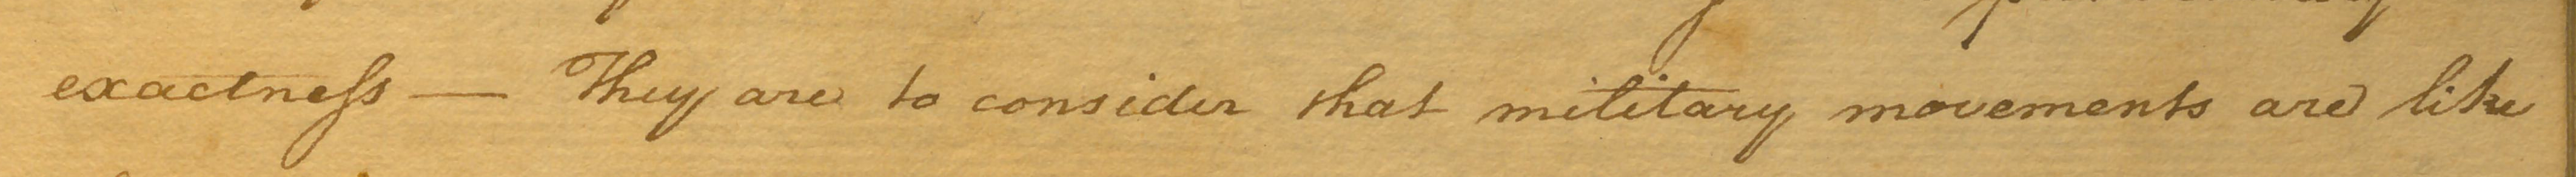exactness- They are to consider that military movements are like
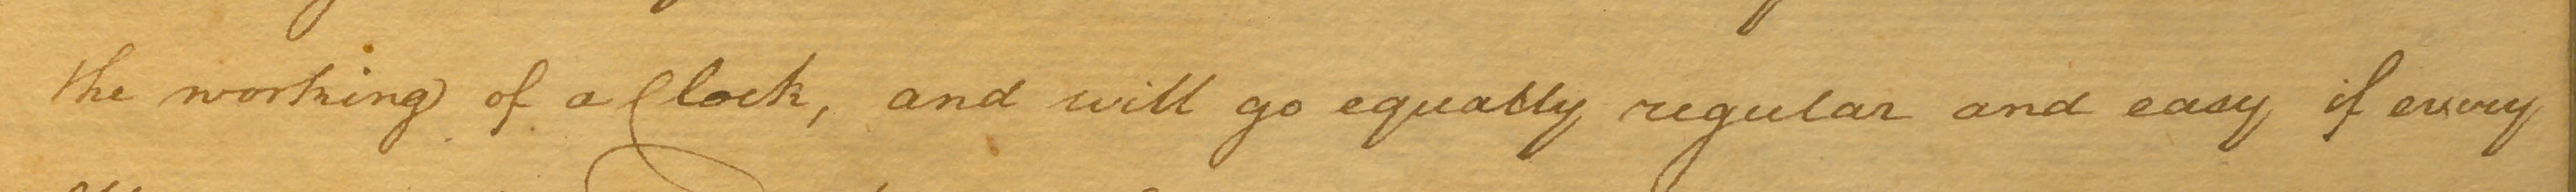the working of a Clock, and will go equally regular and easy if every
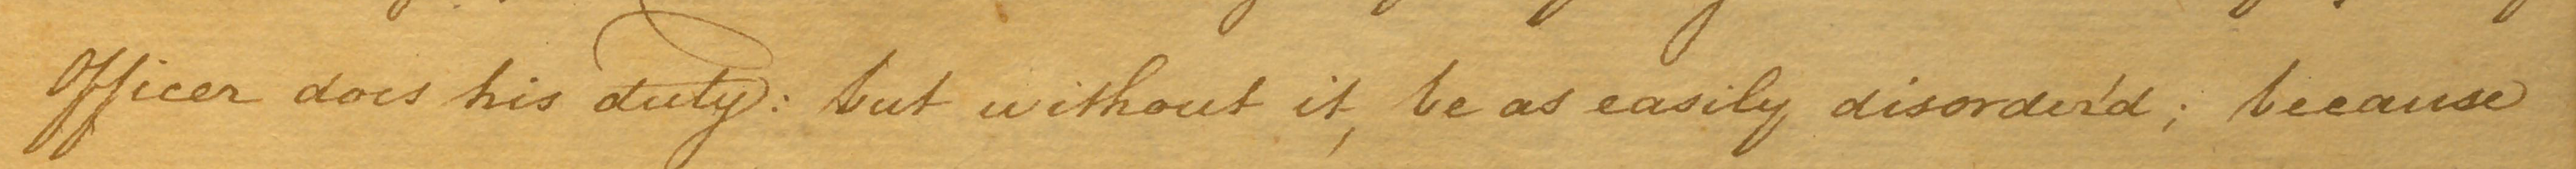Officer does his duty: but without it, be as easily disorder'd; because
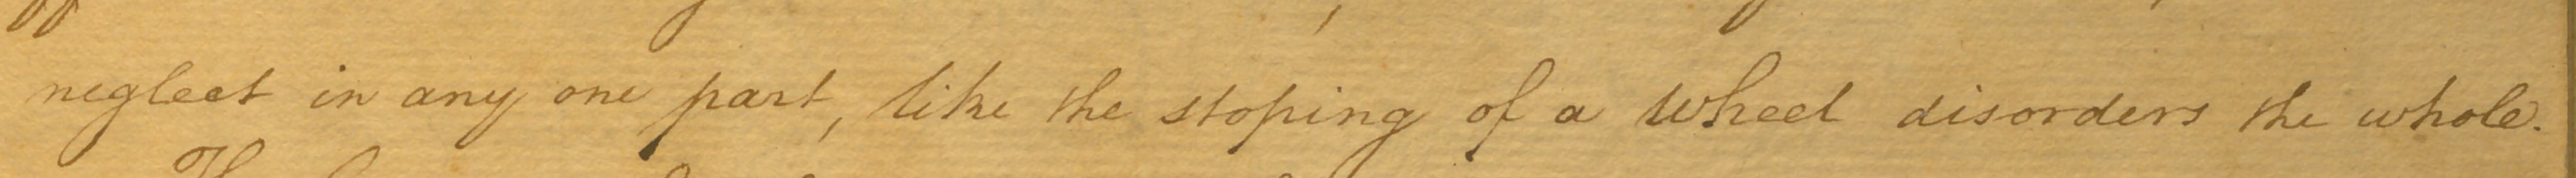neglect in any one part, like the stoping of a wheel disorders the whole.
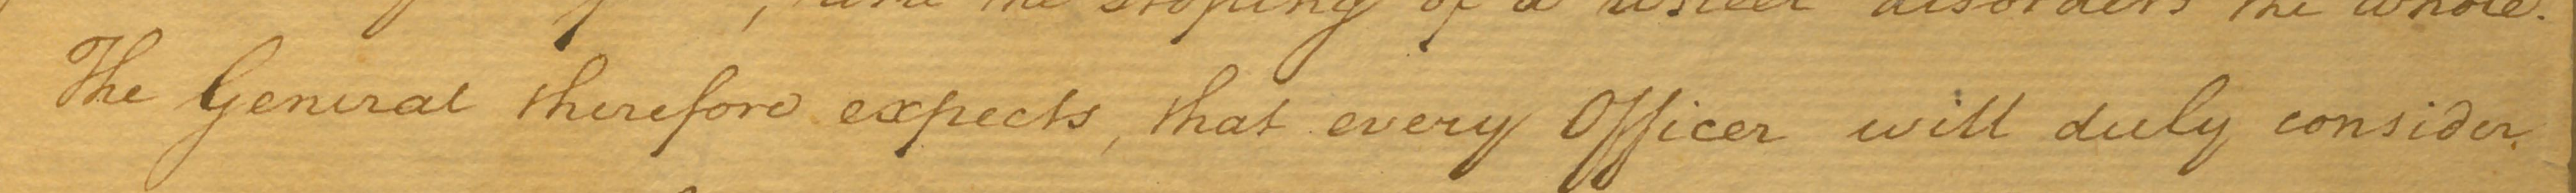The General therefore expects, that every Officer will duly consider
